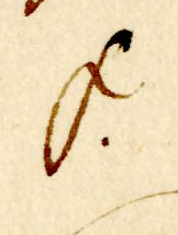&
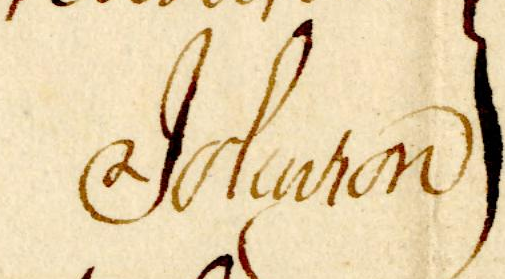Johnson
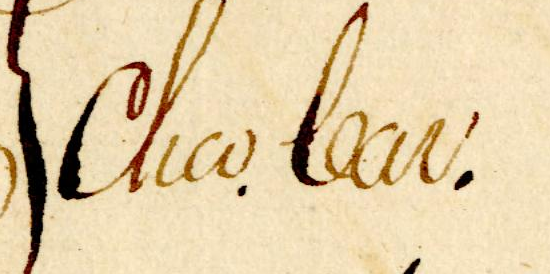Cha. lear.
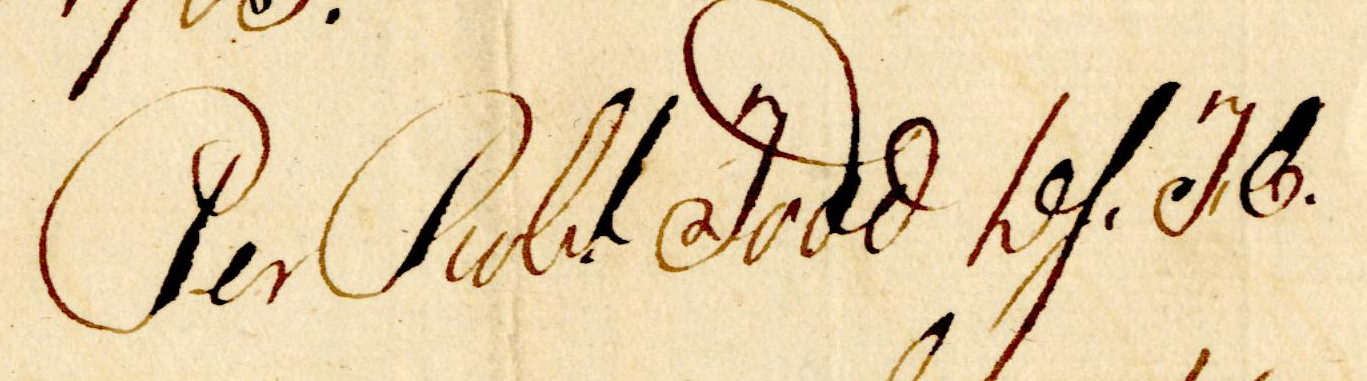Per Rob^t. Todd by 76
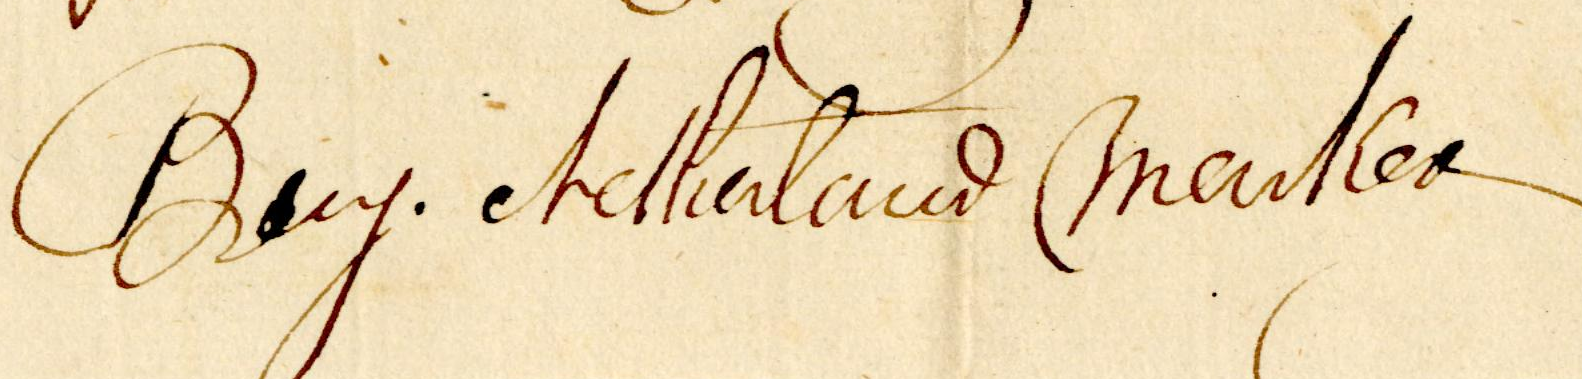Benj.. Netherland Marked
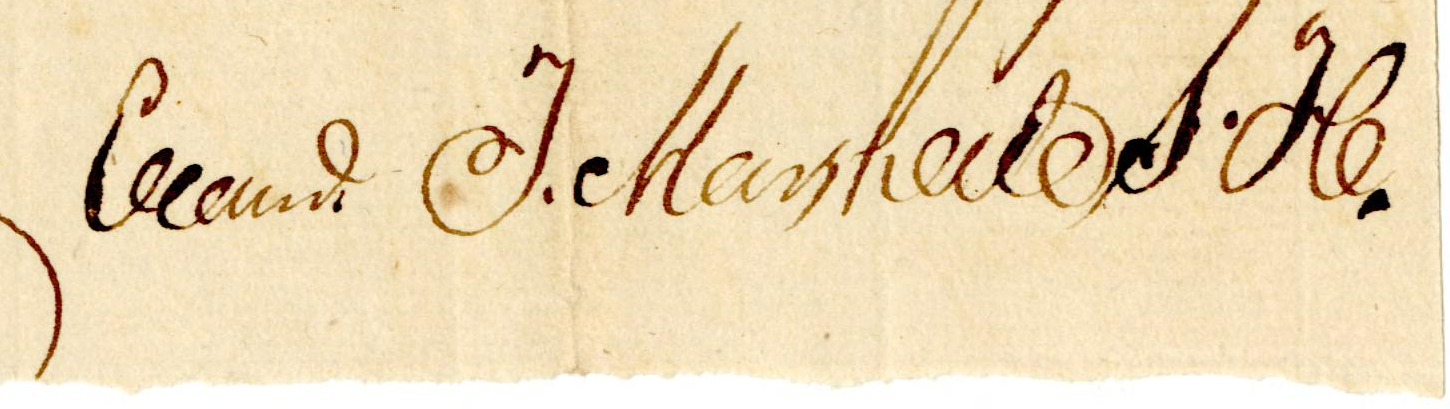Carried J Marshall S. H.
